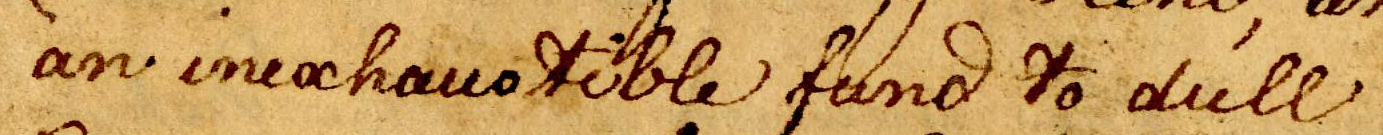an inexhaustible fund to dull
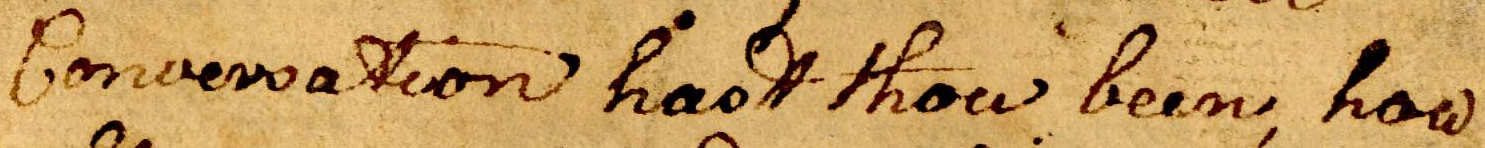Conversation hast thou been, how
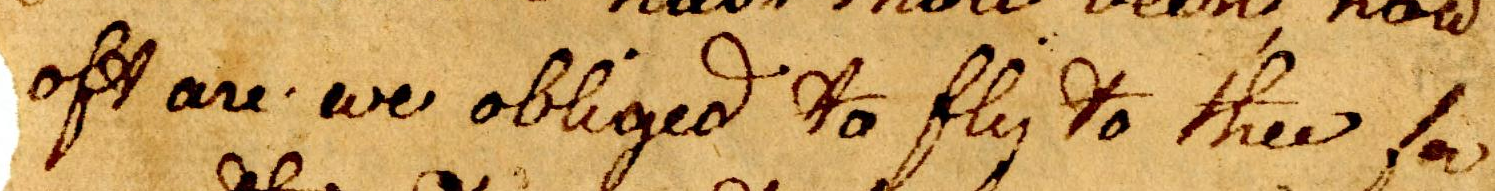oft are we obliged to fly to thee for
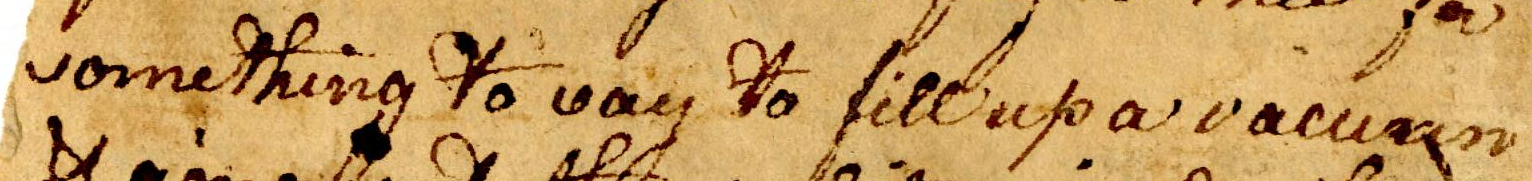something to say to fill up a vacuum
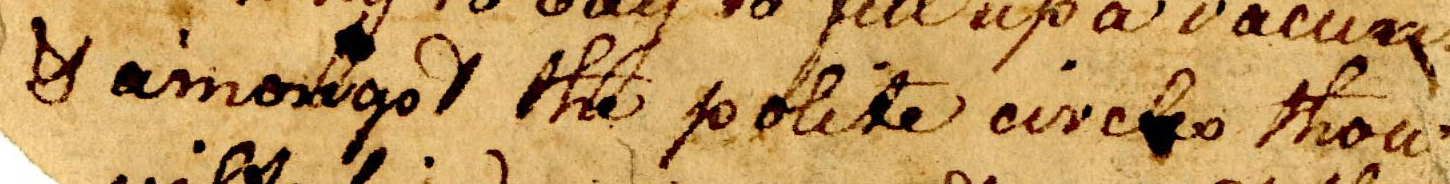& amongst the polite circles thou
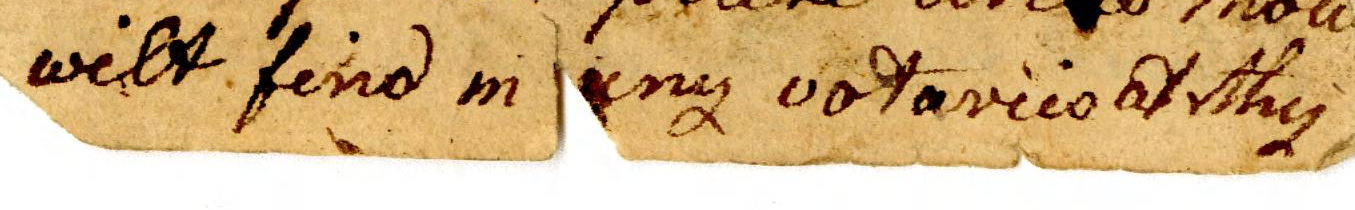wilt find m any votaries at thy
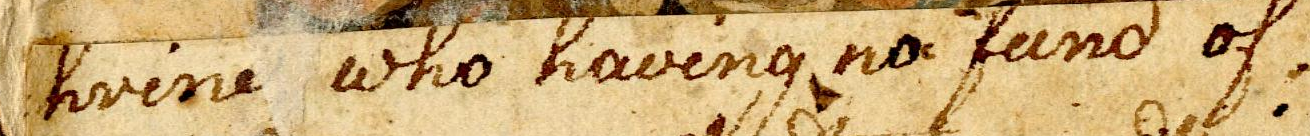hrine who having no fund of
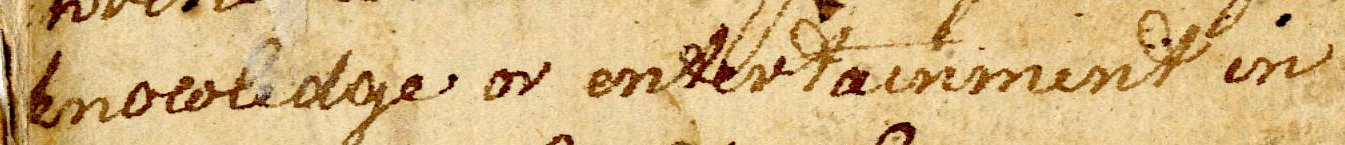knowledge or entertainment in
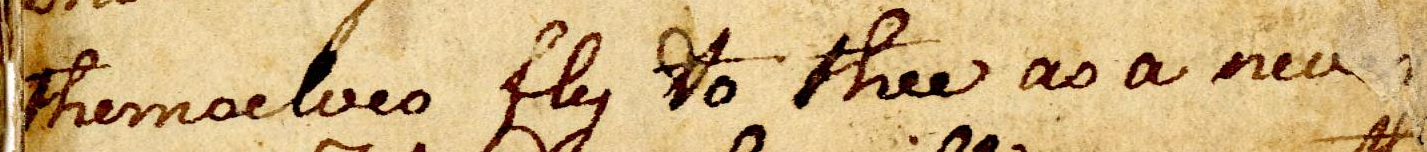themselves fly to thee as a nev
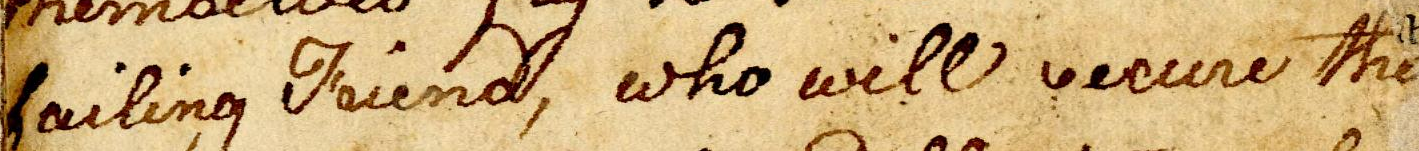failing Friend, who will secure the
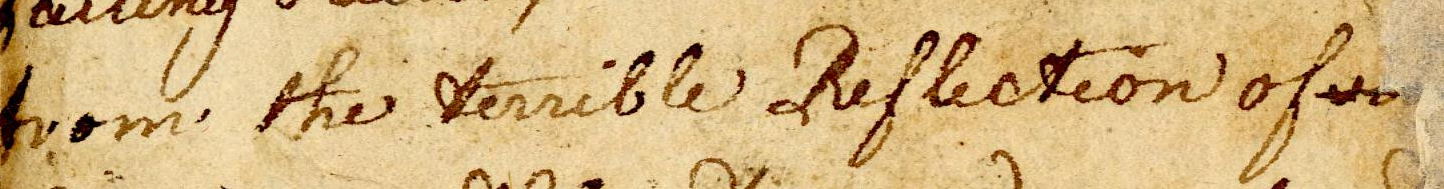from the terrible Reflection of [a]
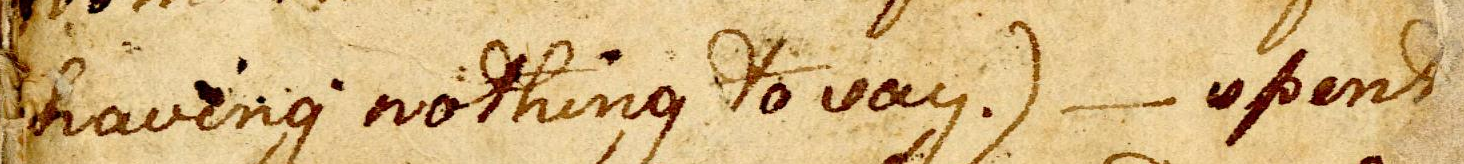having nothing to say.)- spent
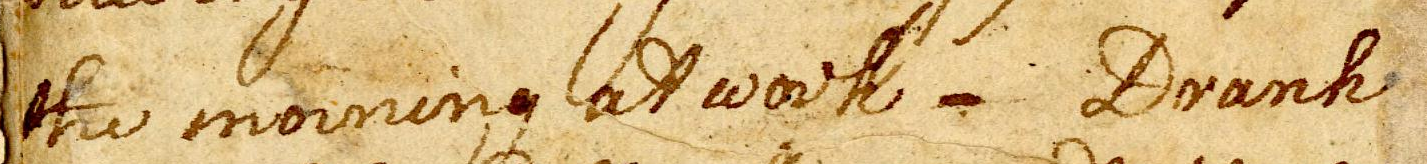the morning at work- Drank
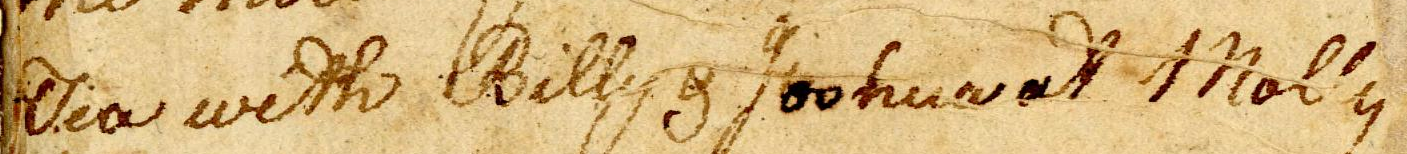Tea with Billy & Joshua at Molly
